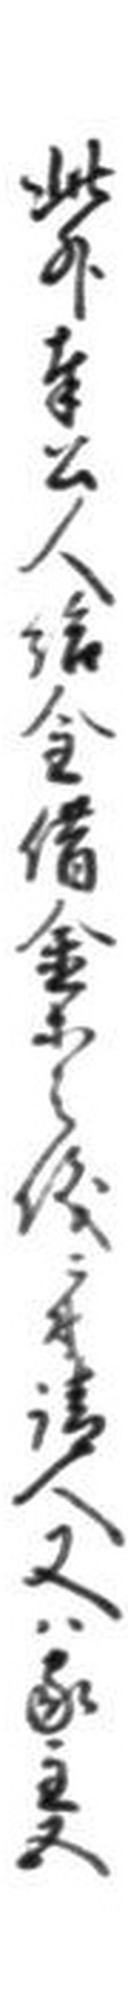此外奉公人給金借金等之儀ニ付請人又ハ家主五
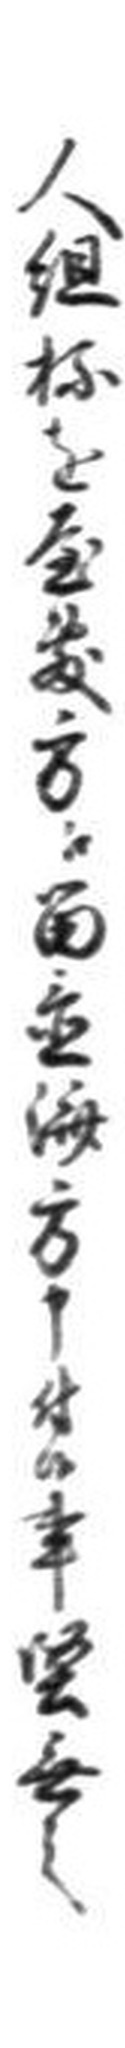人組抔を屋敷方江留置済方申付候事堅無之
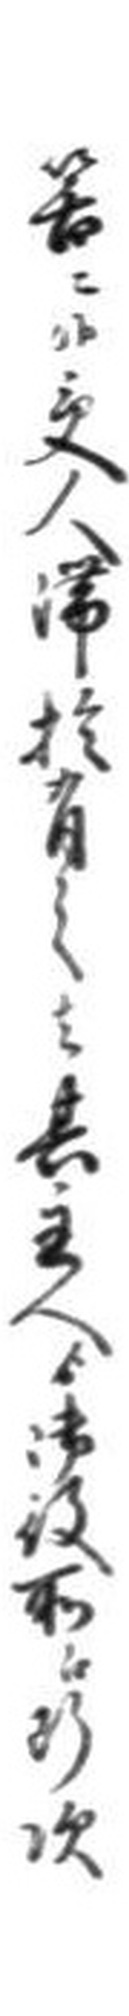筈ニ候受人滞於有之者其主人ゟ御役所江断次
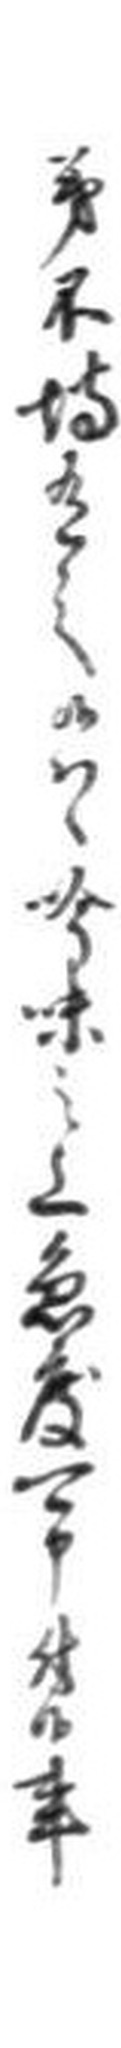第不埒有之候ハヽ吟味之上急度可申付候事
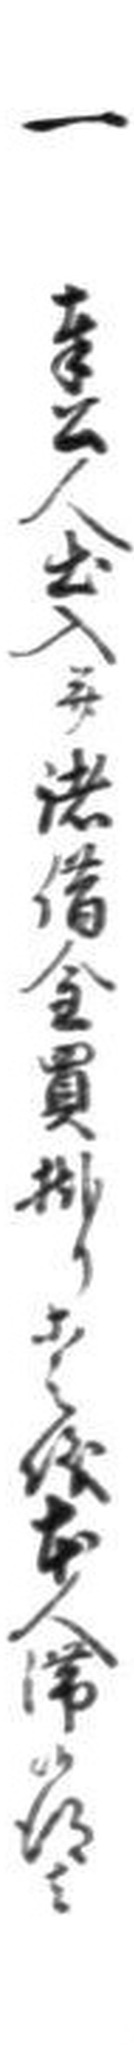一奉公人出入并諸借金買掛り等之儀本人滞候得者
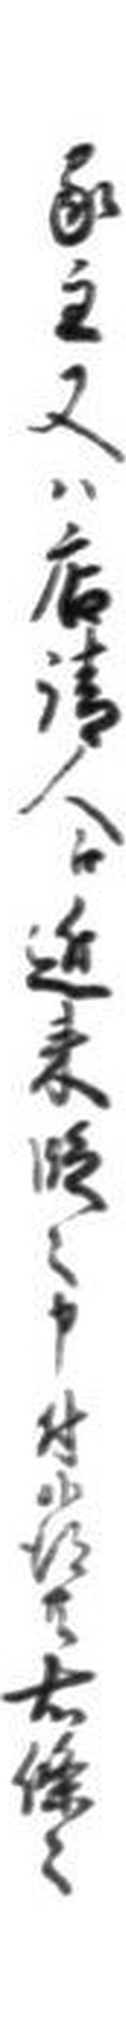家主又ハ店請人江近来段々申付候得共右条々
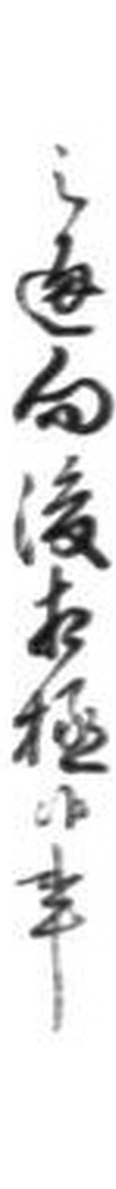之通向後相極候事

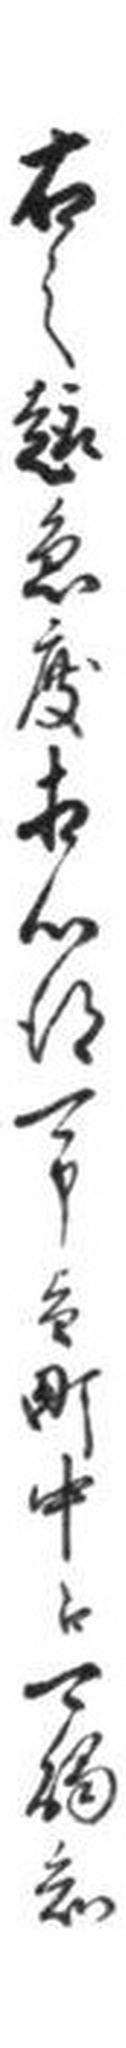右之趣急度相心得可申旨町中江可触知
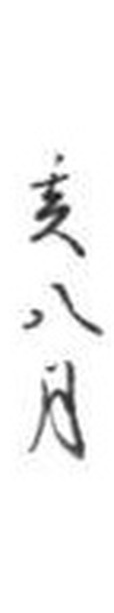亥八月
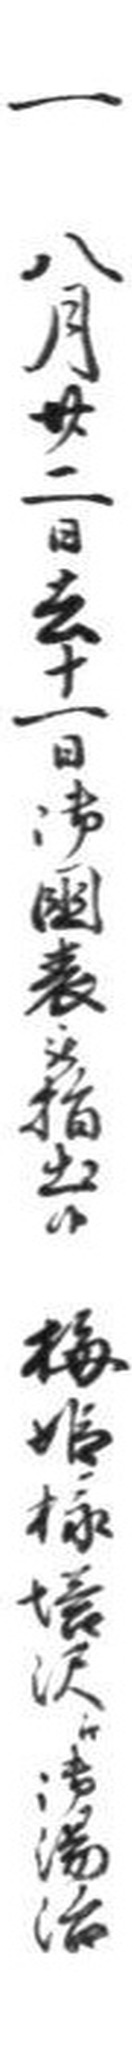一八月廿二日去十一日御国表被指出候梅姫様塔沢江御湯治
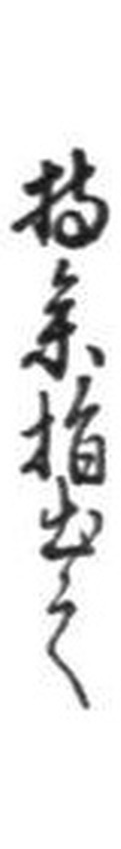持参指出之
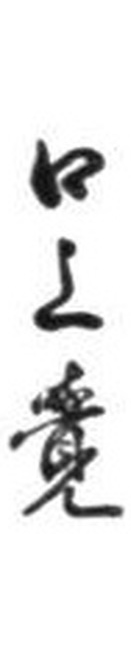口上覚
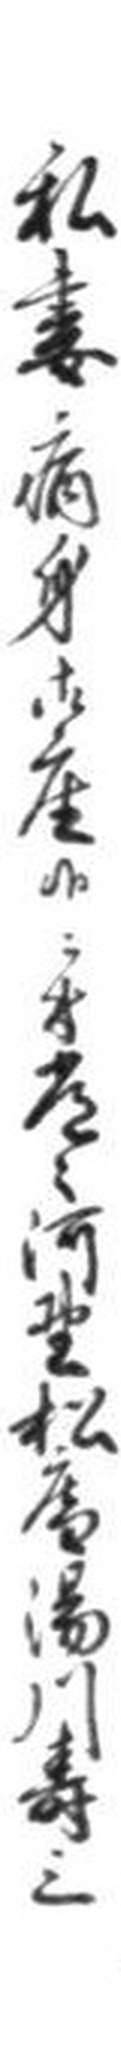私妻病身御座候ニ付常々河野松庵湯川寿三
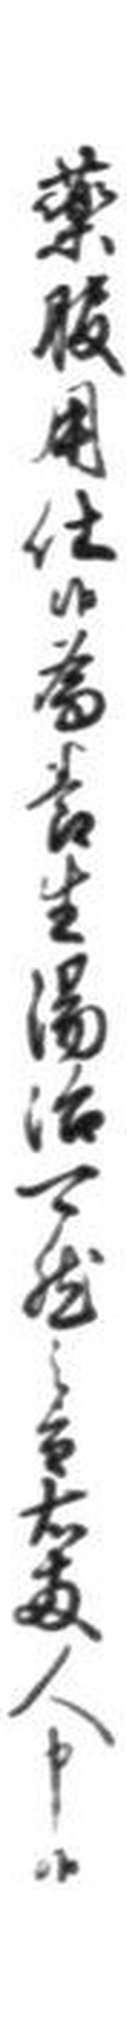薬服用仕候為養生湯治可然之旨両人申候
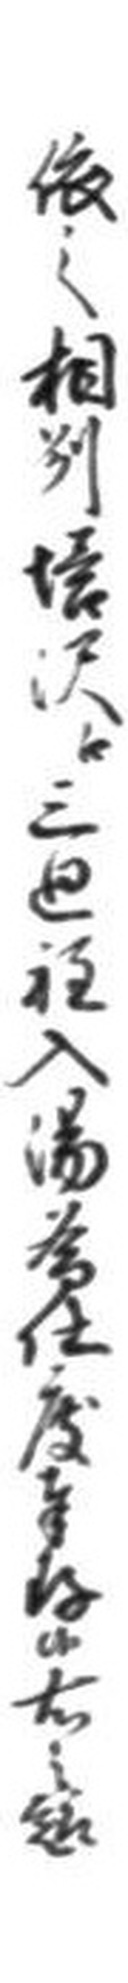依之相州塔沢江三廻程入湯為仕度奉存候右之趣
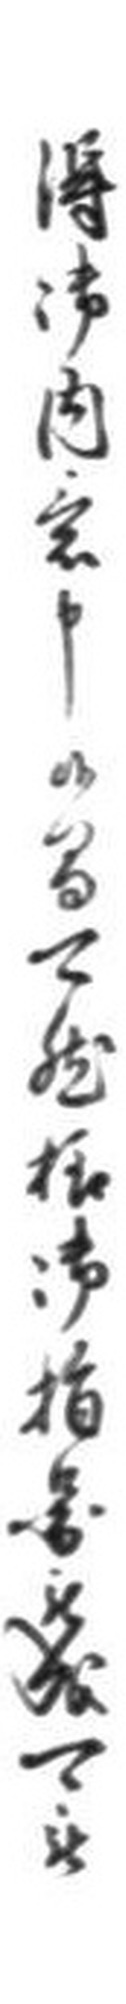得御内意申候間可然様御指図被成可被
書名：家譜 三十三 吉邦公 享保四年
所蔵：福井県文書館 Fukui Prefectural Archives
